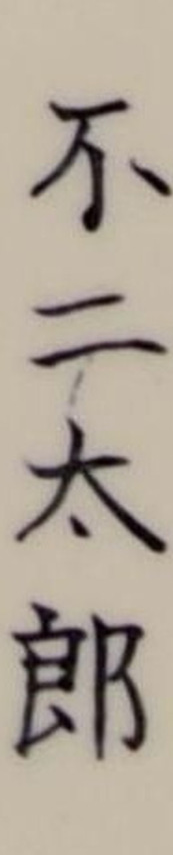不二太郎
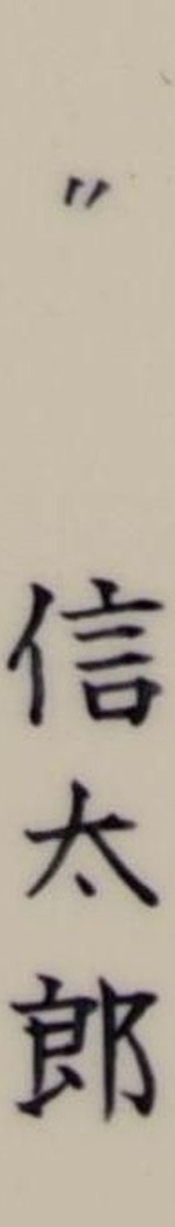信太郎
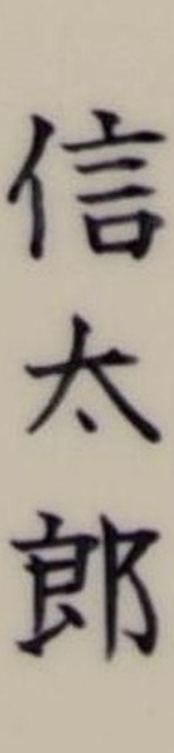信太郎
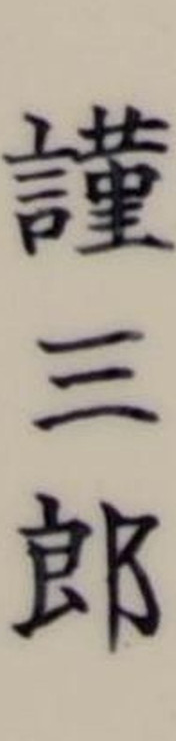謹三郎
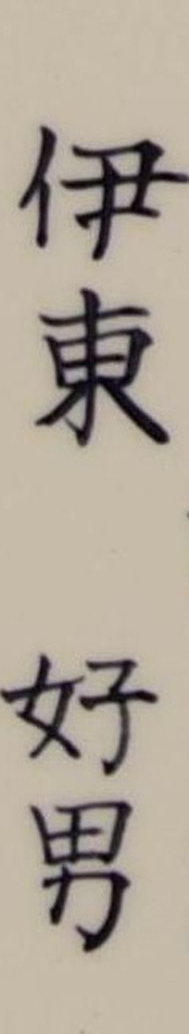伊東好男
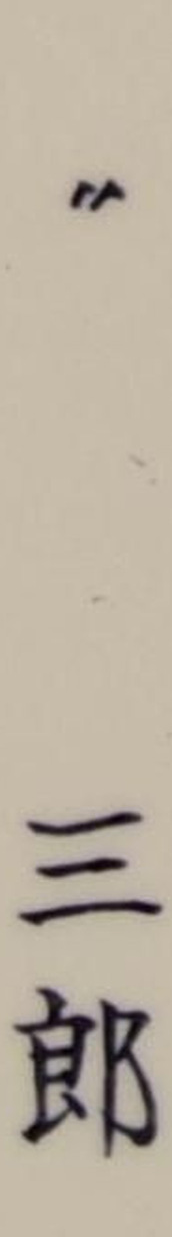喜三郎

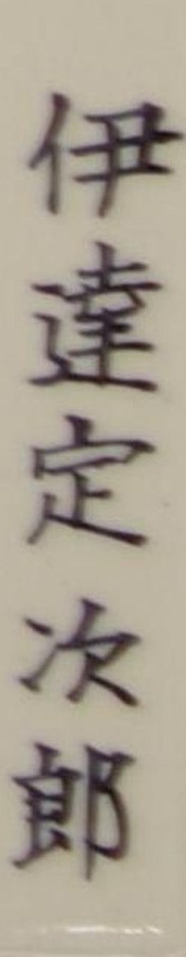伊達定次郎
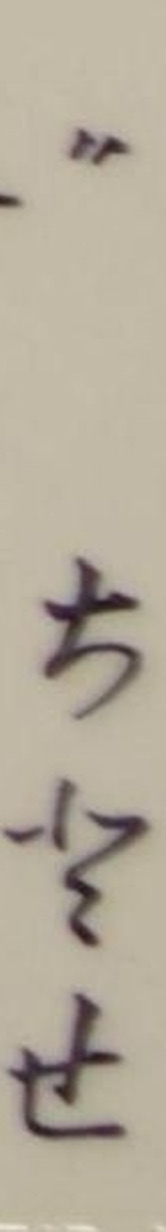ちとせ
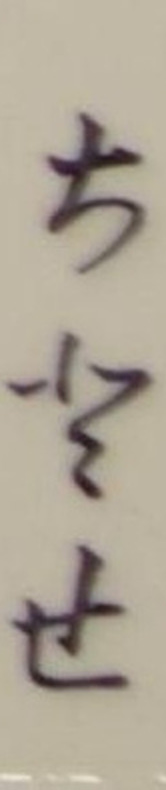ちとせ
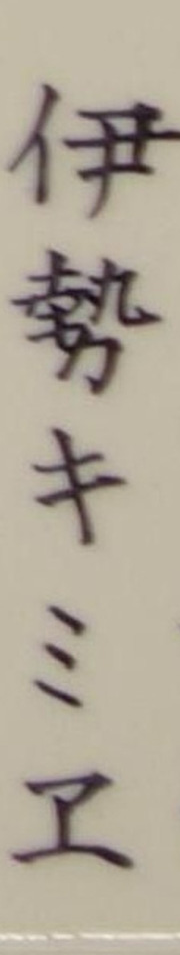伊勢キミエ
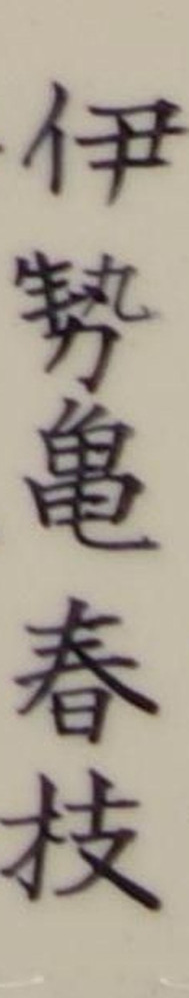伊勢亀春枝
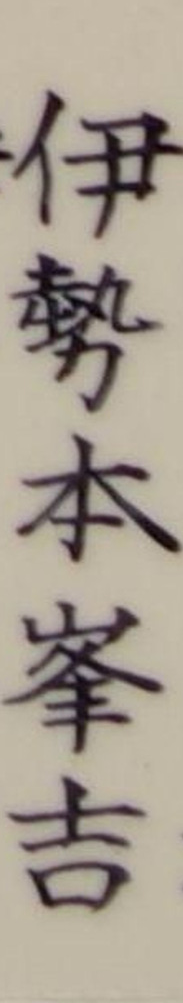伊勢本峯吉
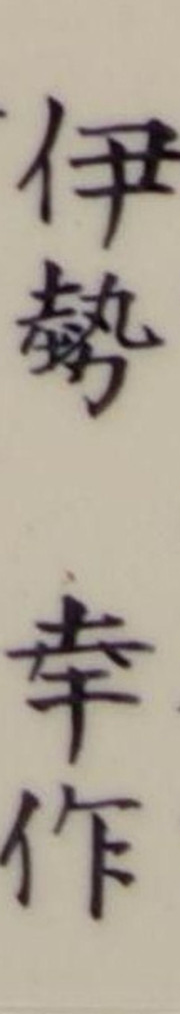伊勢幸作
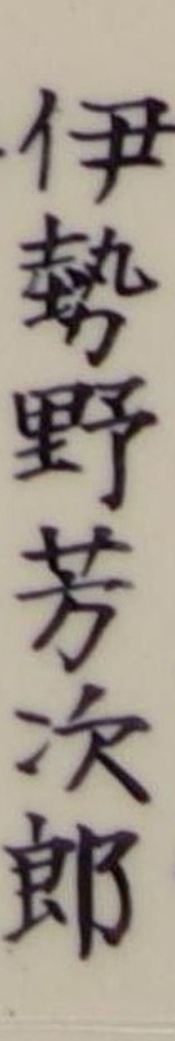伊勢野芳次郎
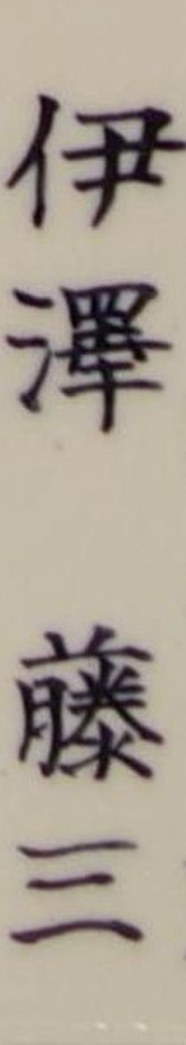伊澤藤三
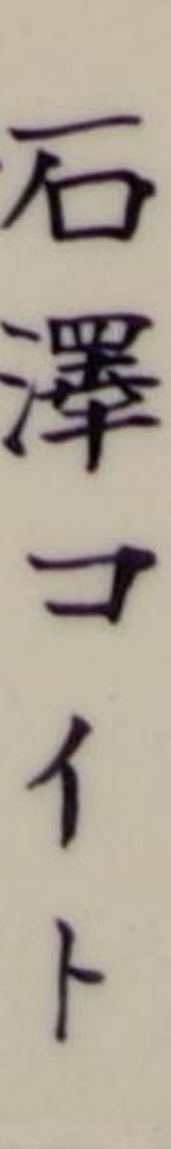石澤コイト
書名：M~S
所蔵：高野山金剛峯寺
